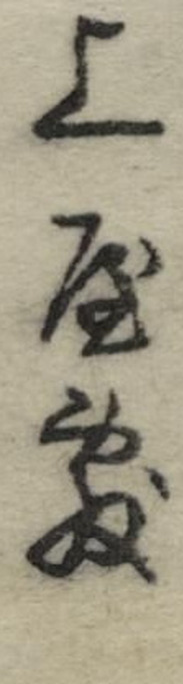上屋敷
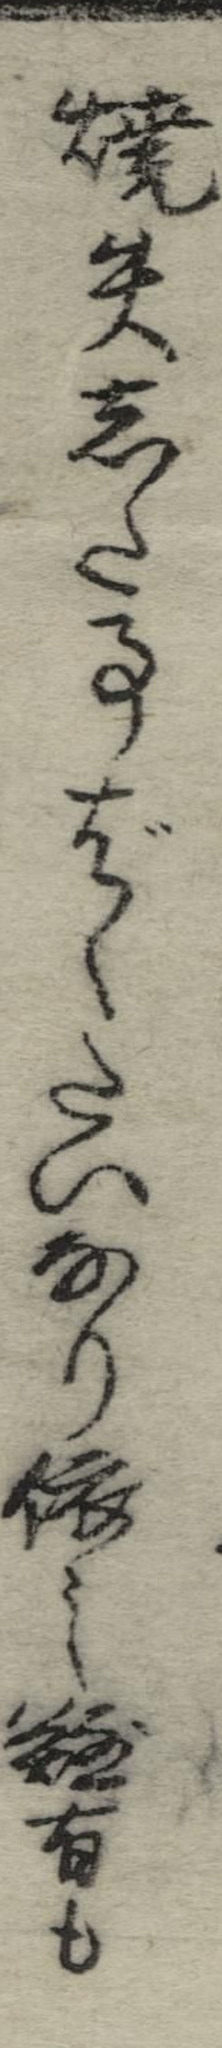焼失した事ばくだいなり依之難有も
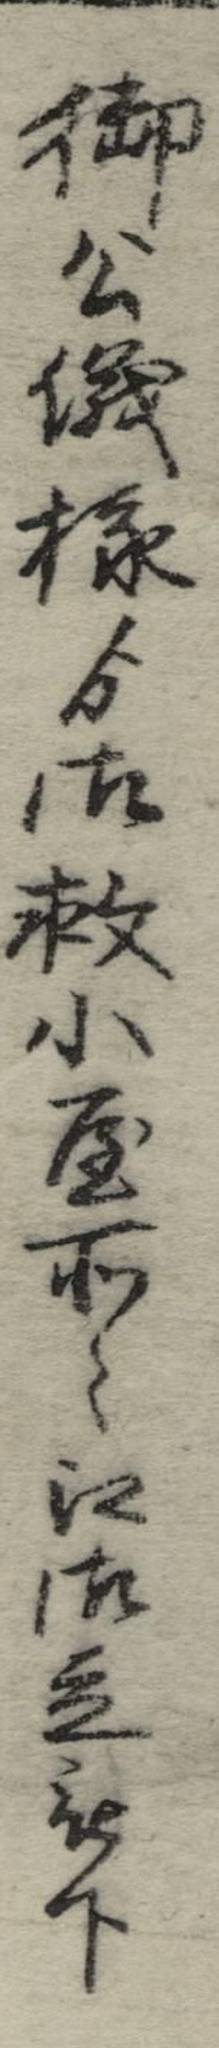御公儀様ゟ御救小屋所々江御立被下
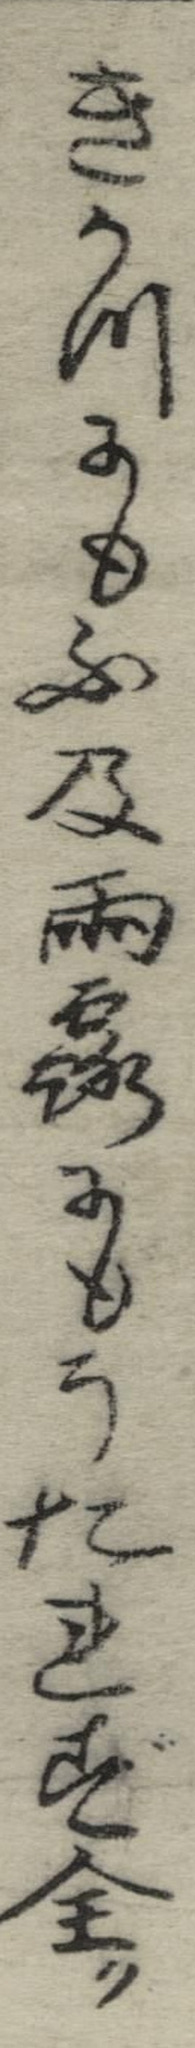きかつにも不及雨露にもうたれず全く
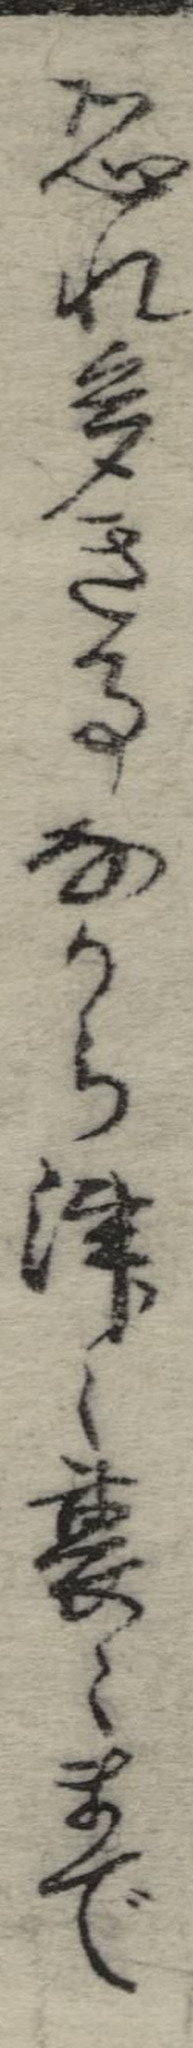恐れ多き事なから津々裏々まで
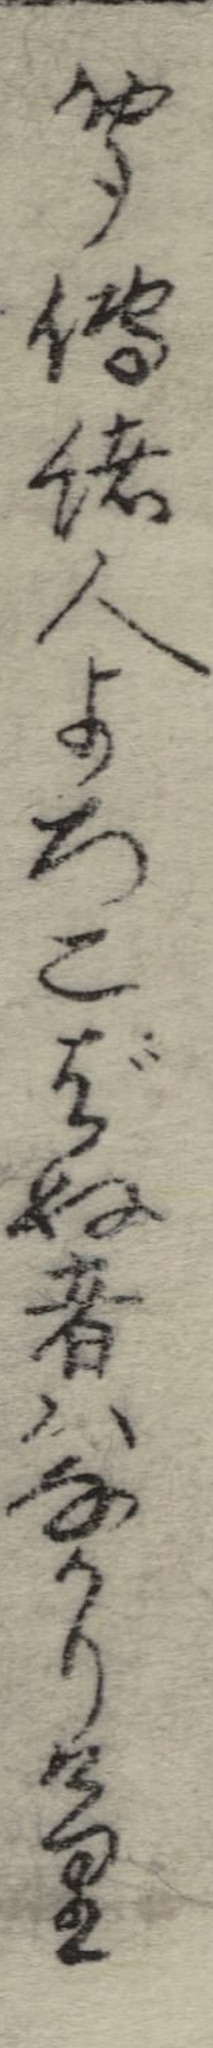聞傳諸人よろこばぬ者はなかりけり
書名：[天保五年二月の江戸大火に関する瓦版]
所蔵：東京大学地震研究所図書室 Earthquake Research Institute Library, The University of Tokyo, JAPAN
